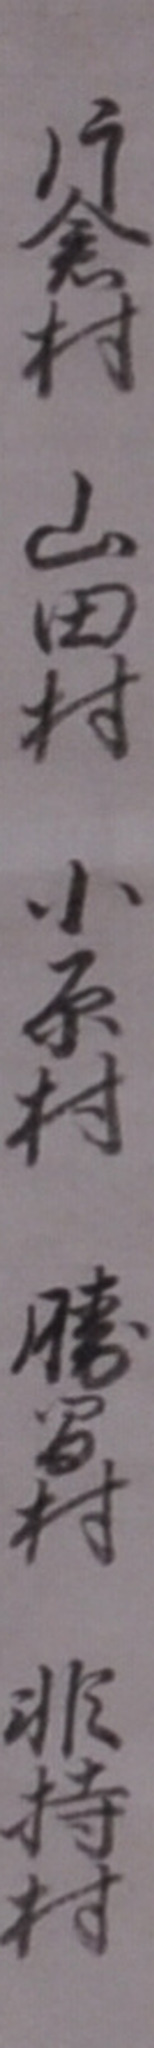片倉村山田村小原村勝間村非持村
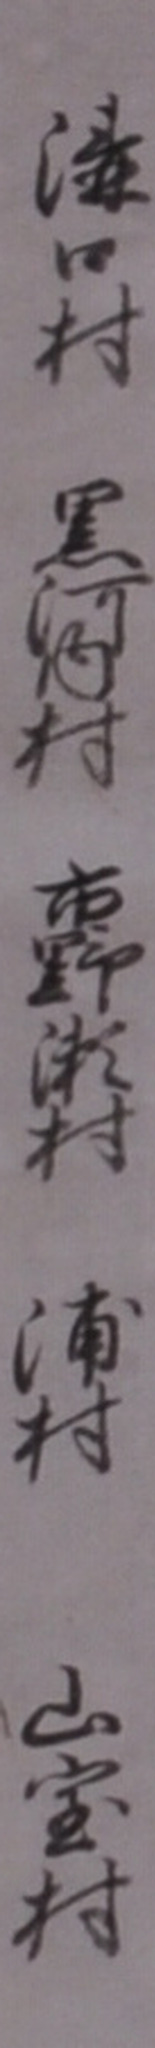溝口村黒河内村市野瀬村浦村山室村
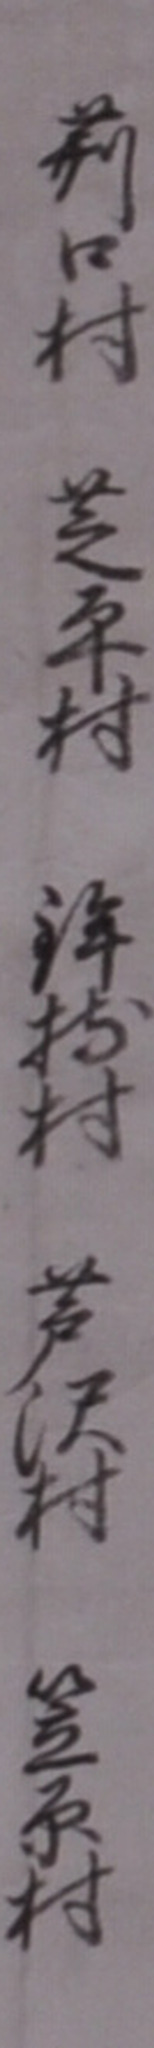荊口村芝平村鉾持村芦沢村笠原村
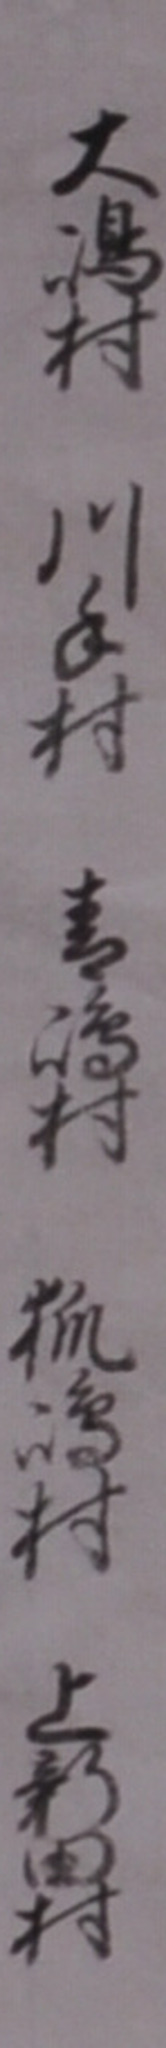大島村川手村青島村狐島村上新田村
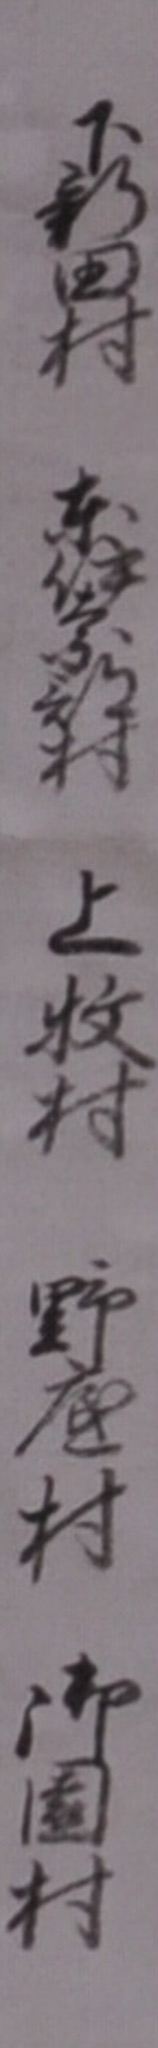下新田村東伊奈部村上牧村野底村御園村
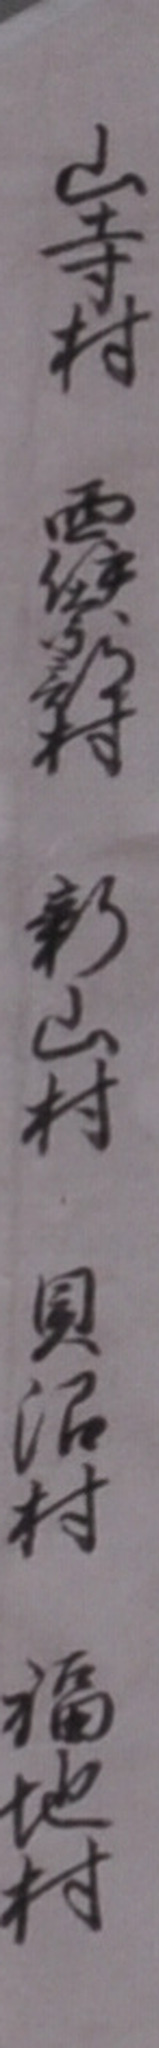山寺村西伊奈部村新山村貝沼村福地村
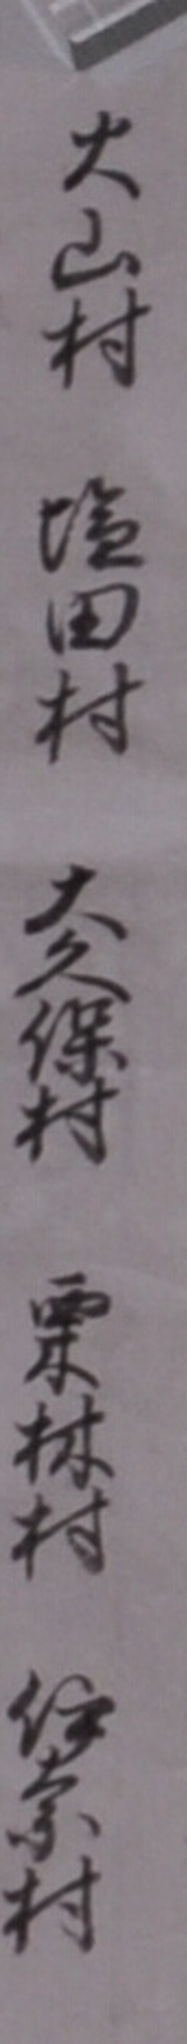火山村塩田村大久保村栗林村伊奈村
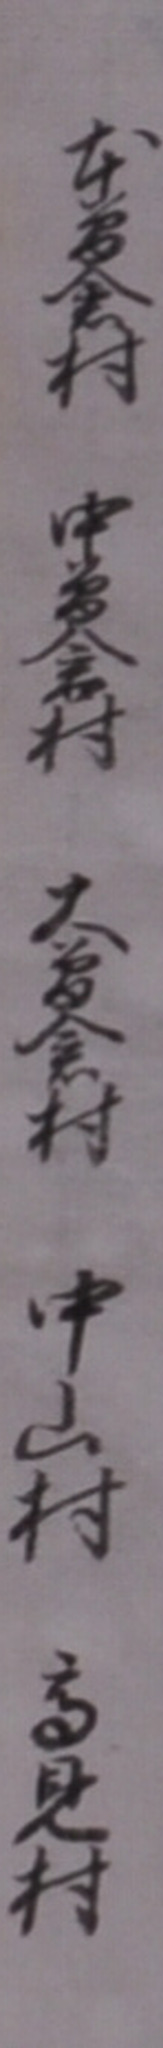本曽倉村中曽倉村大曽倉村中山村高見村

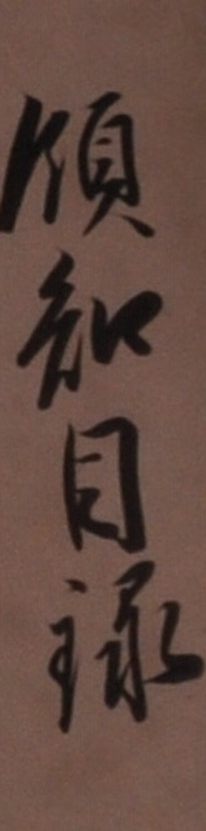領知目録
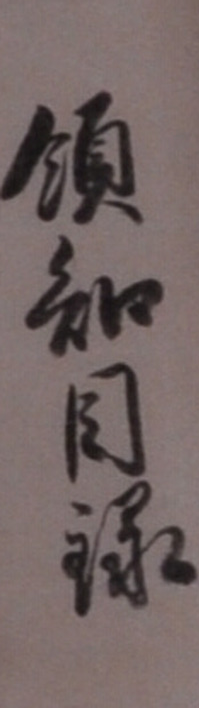領知目録
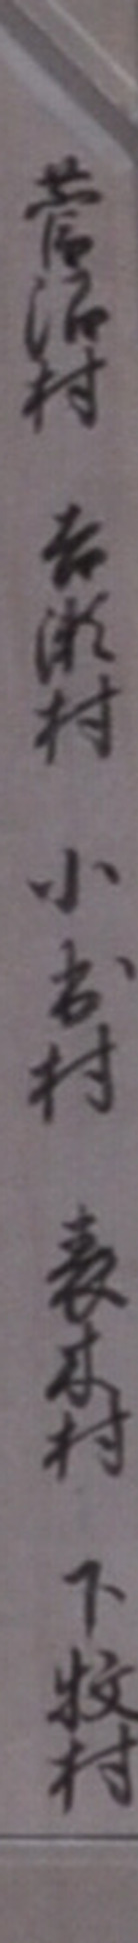菅沼村吉瀬村小出村表木村下牧村
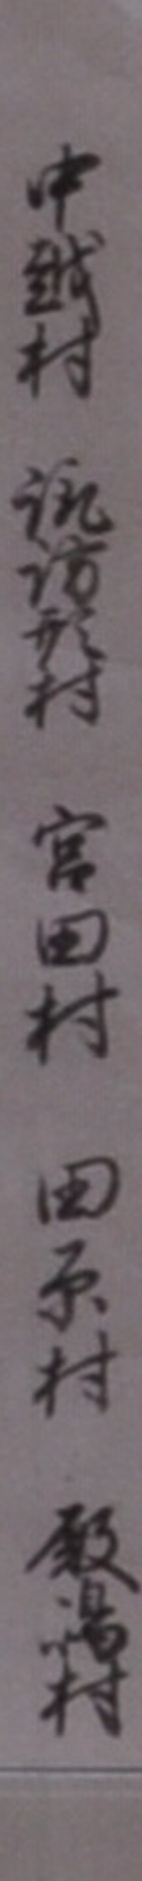中越村諏訪形村宮田村田原村殿島村
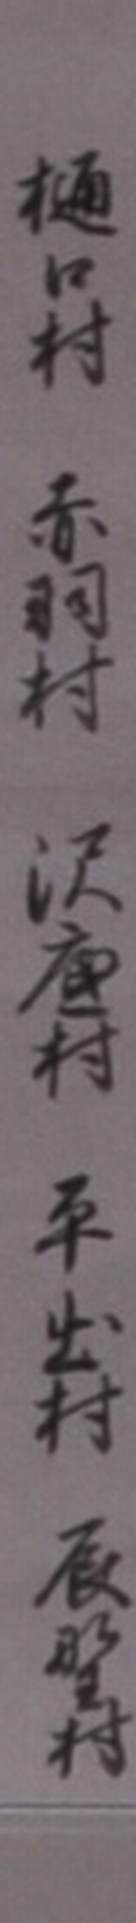樋口村赤羽村沢底村平出村辰野村
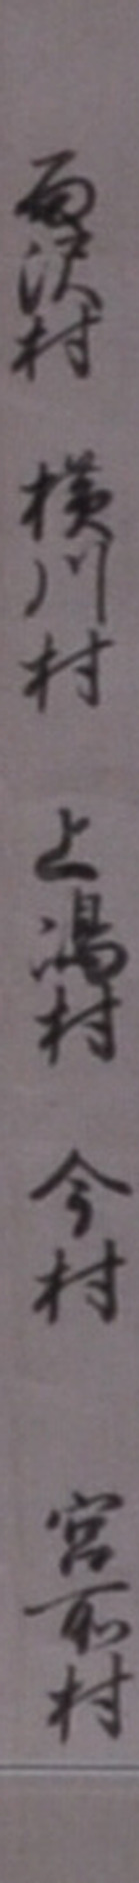雨沢村横川村上島村今村宮所村
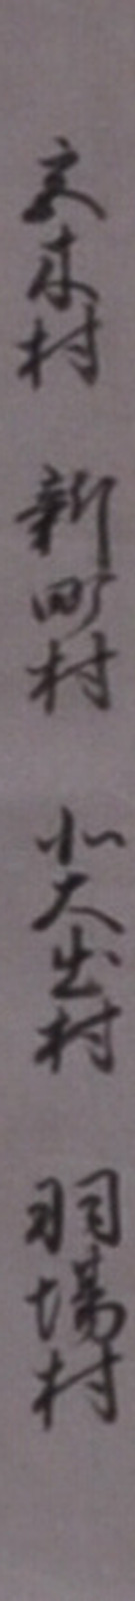宮木村新町村北大出村羽場村
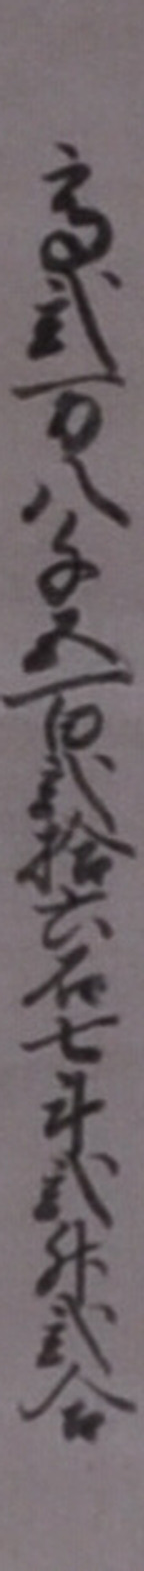高弐万八千五百弐拾六石七斗弐升弐合
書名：御朱印写・領地目録
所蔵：伊那市立高遠町図書館・合同会社AMANE
